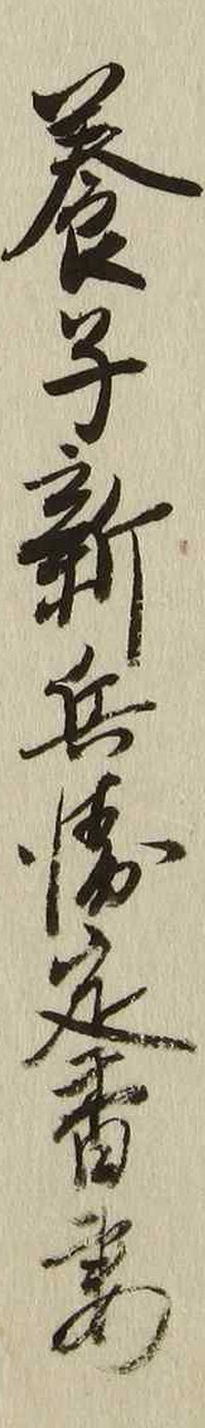女養子新兵衛定香妻
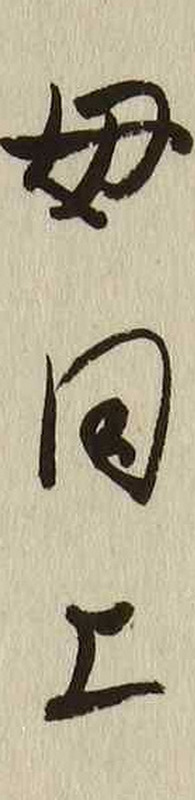母同上
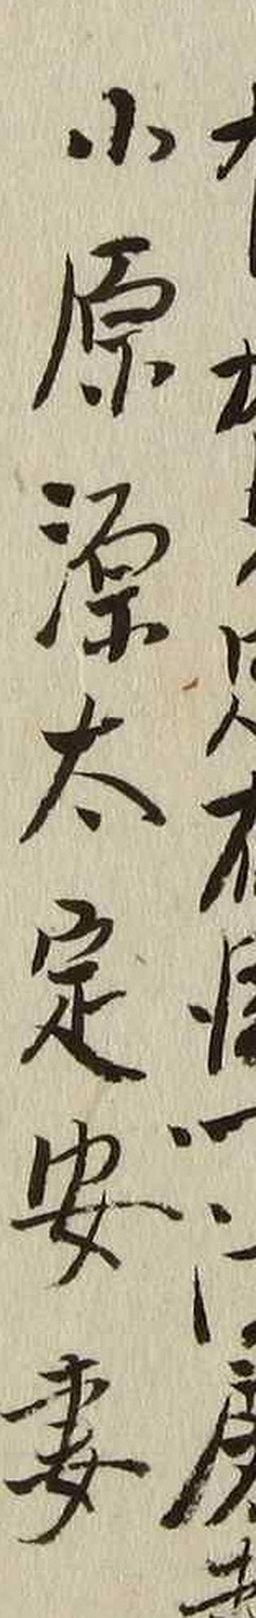小原源太定安妻
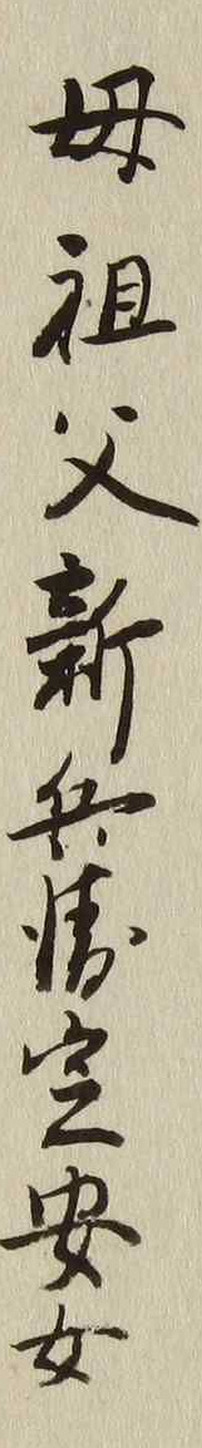母祖父新兵衛定安女
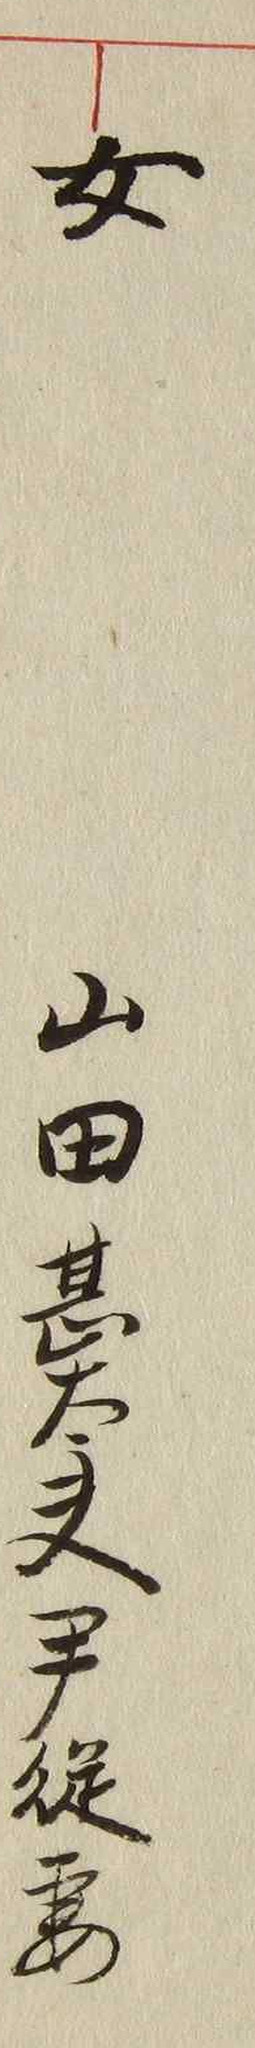女山田甚太夫尹従妻
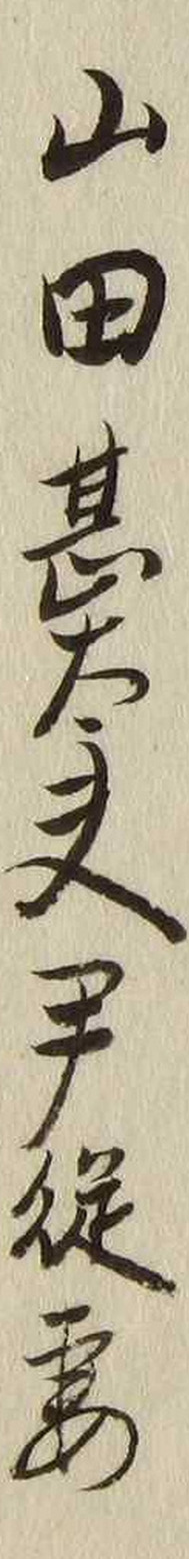女山田甚太夫尹従妻
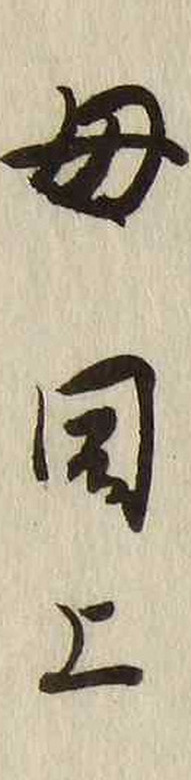母同上

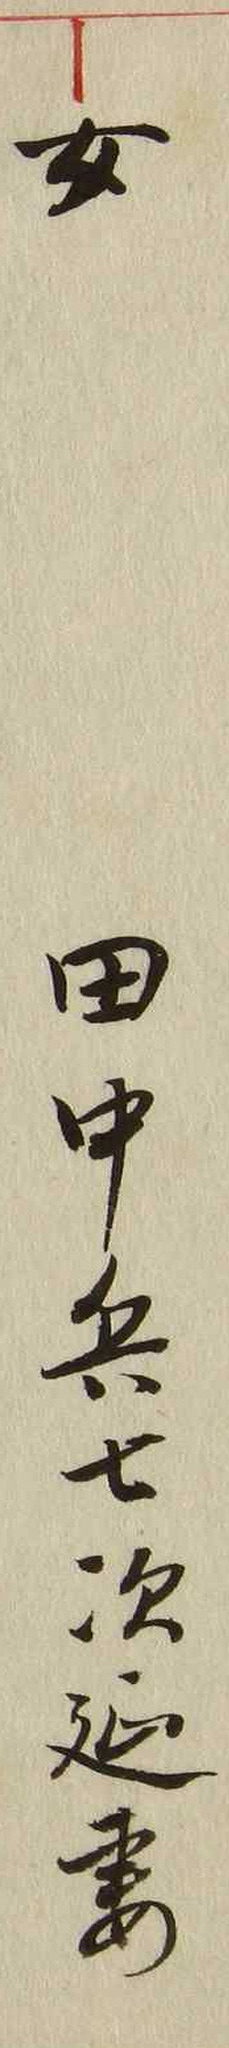女田中兵七次延妻
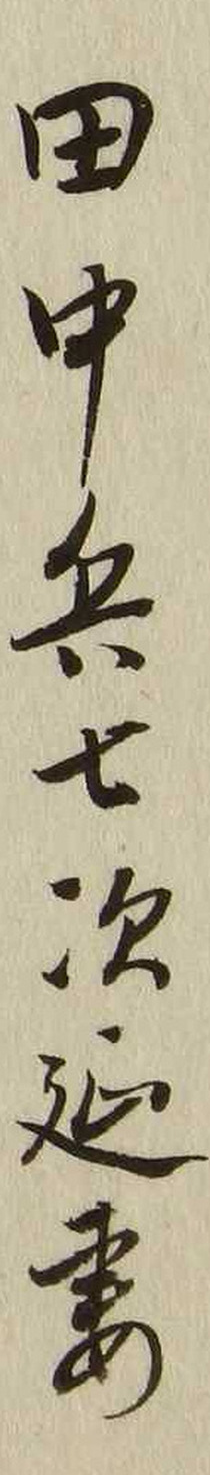女田中兵七次延妻
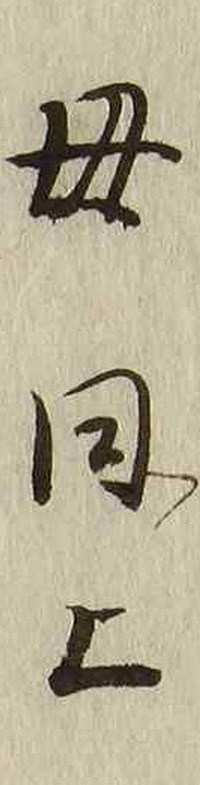母同上
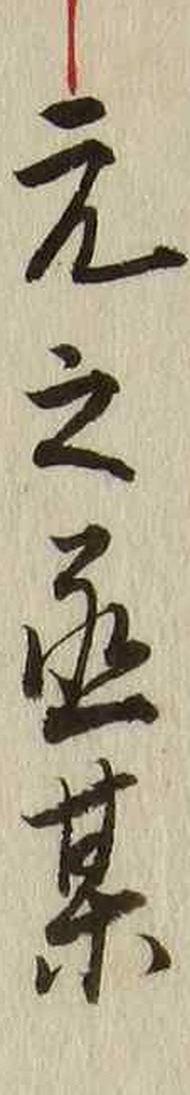元之丞某
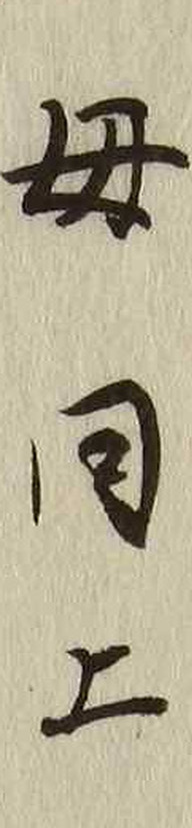母同上
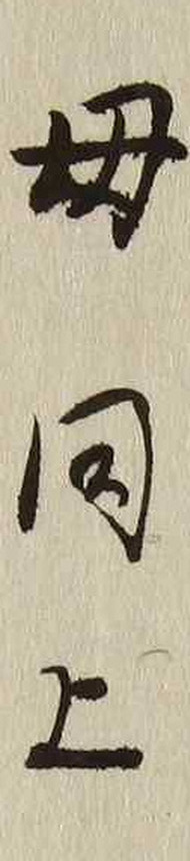母同上
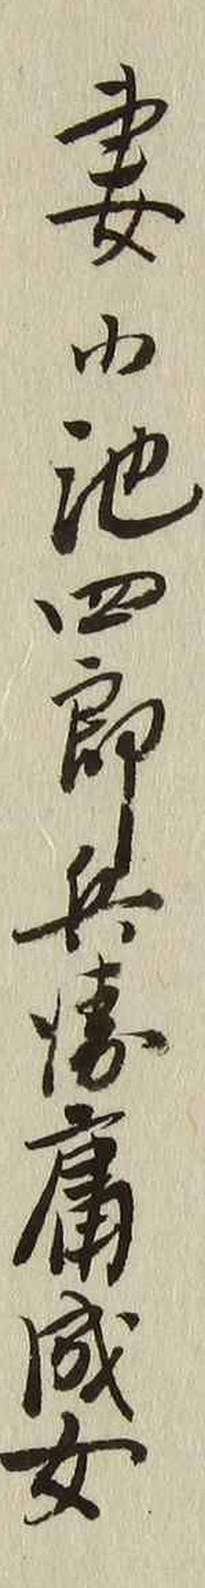妻小池四郎兵衛庸成女
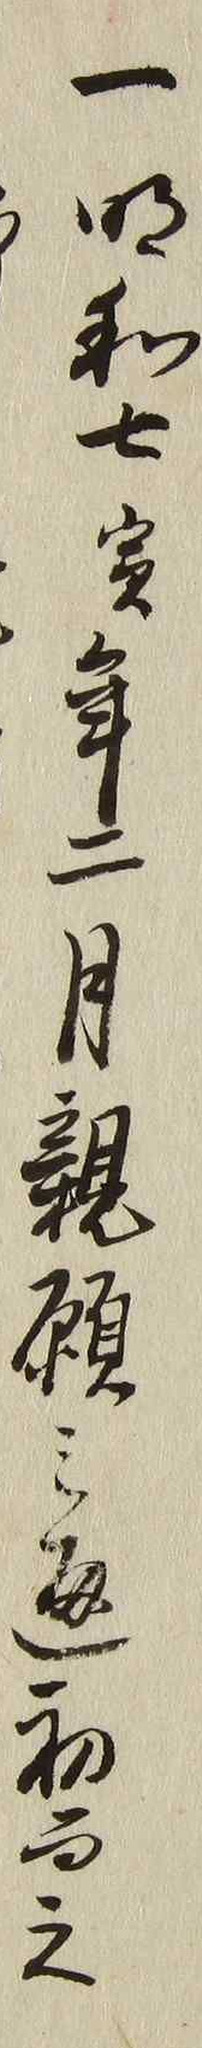一明和七寅年二月親願之通初而之
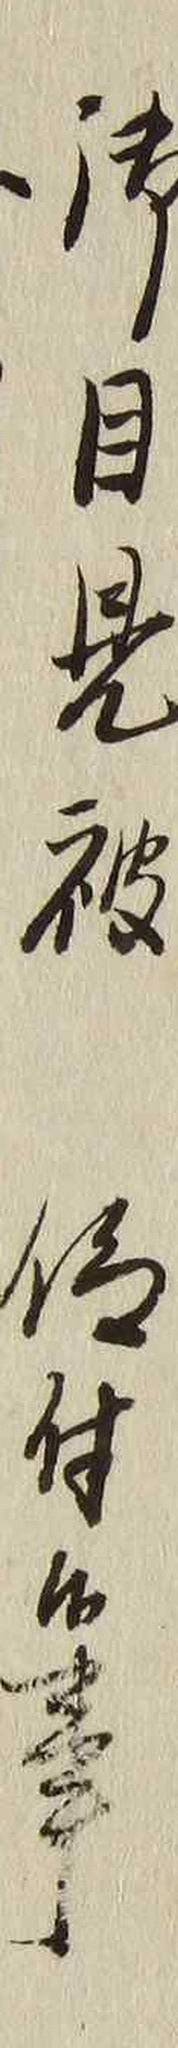御目見被仰付候事
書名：諸士系譜　巻之348　も之部4
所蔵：会津若松市立会津図書館
